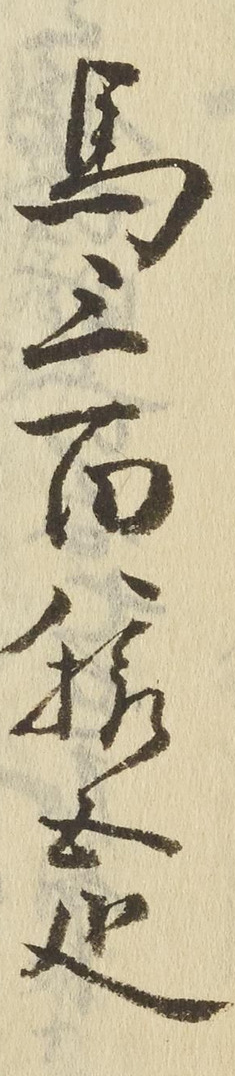馬三百八拾五疋
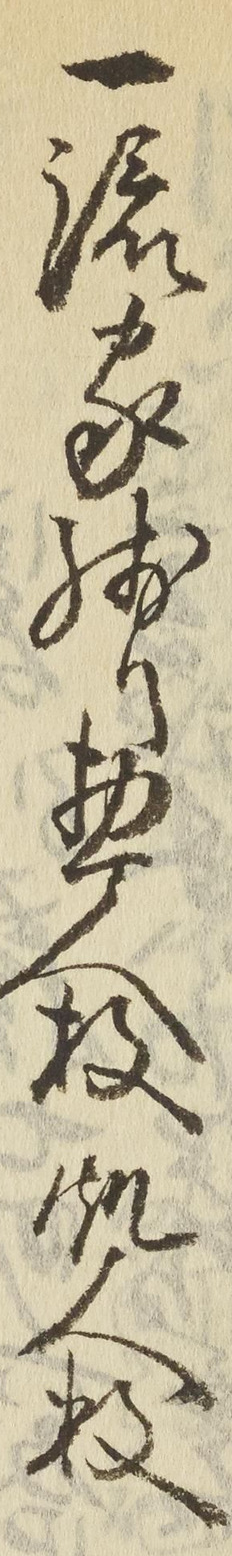一流家残り惣人数飢人数
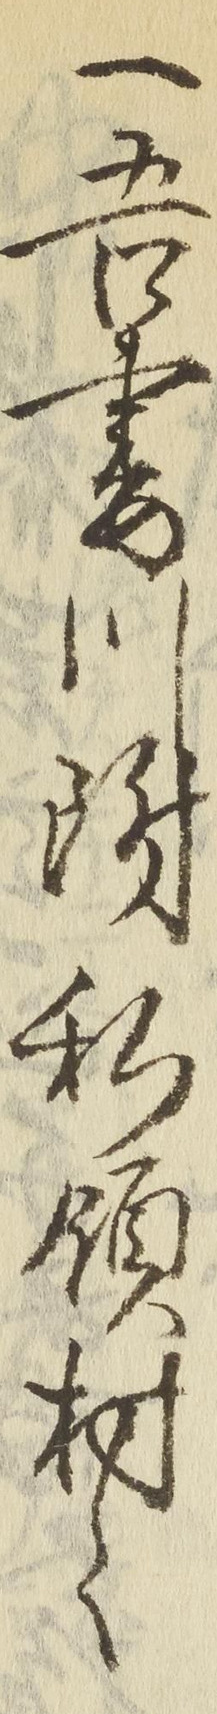一吾妻川附私領村々
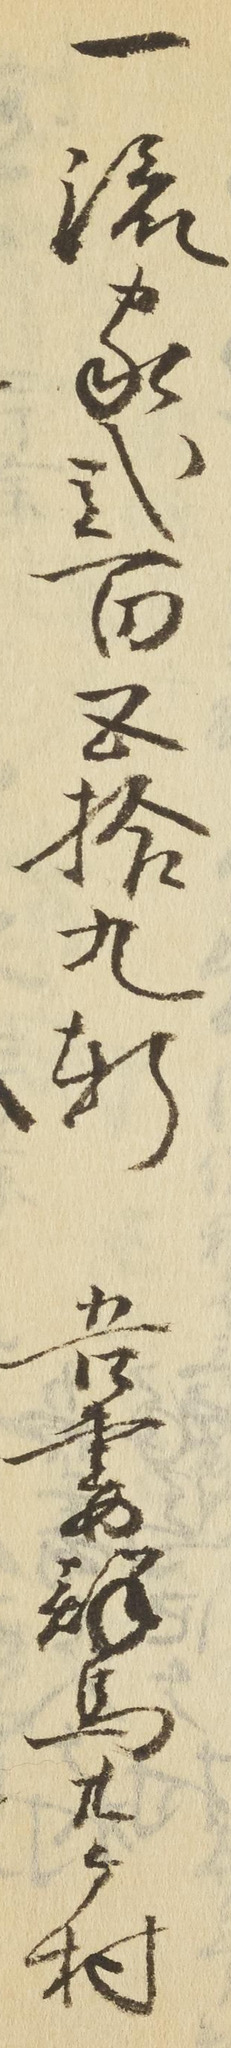一流家弐百五拾九軒吾妻群馬廿ヶ村
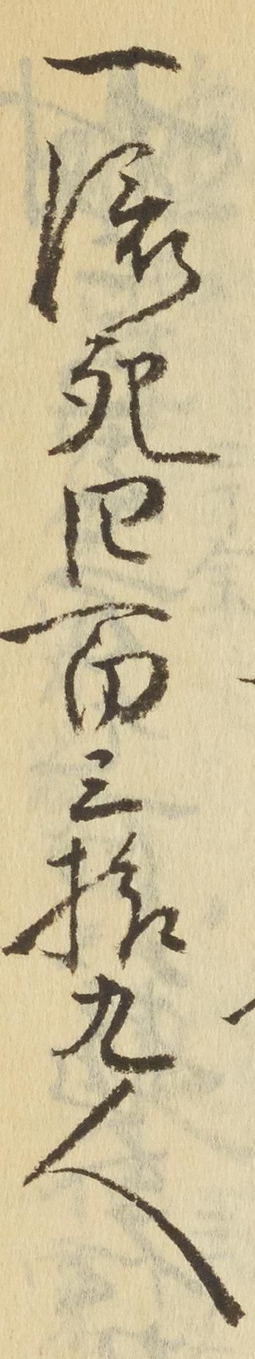一流死千三百七拾三人
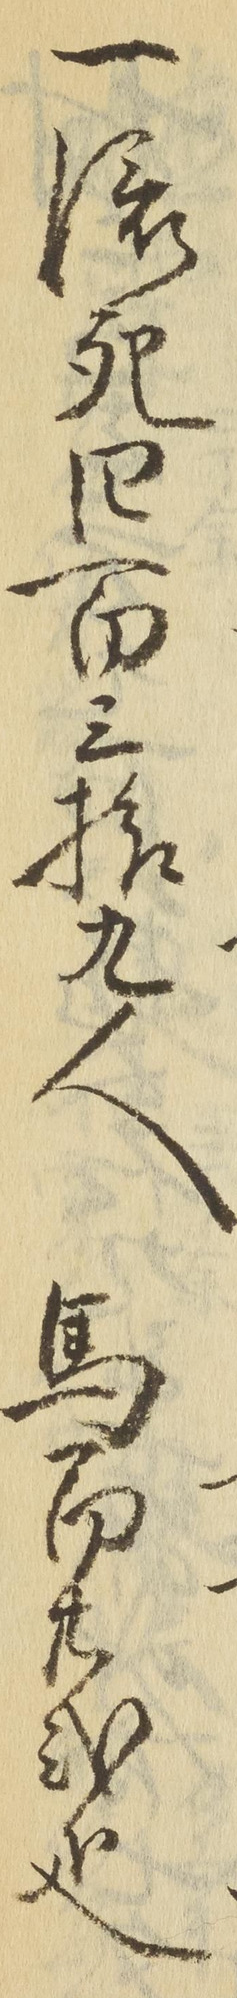一流死四百拾十九人百廿弐疋
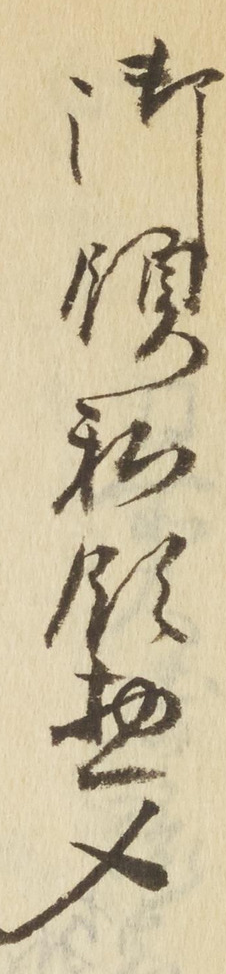御領私領惣〆
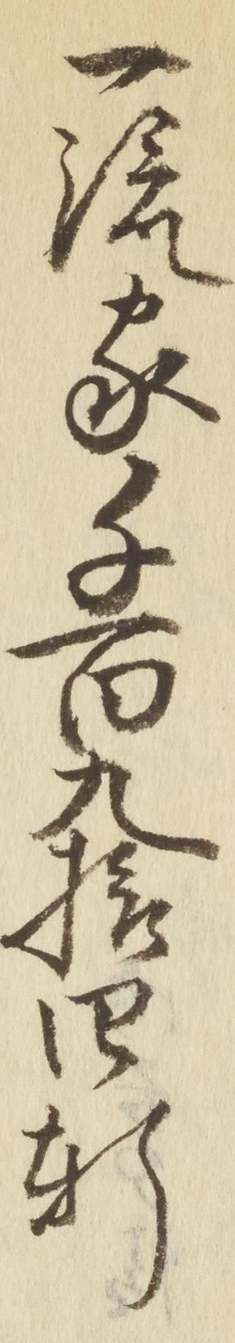一流家千百九拾四軒
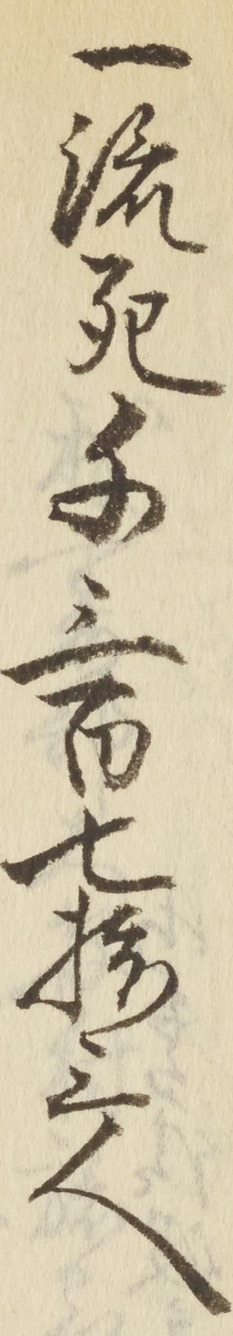一流死千三百七拾三人
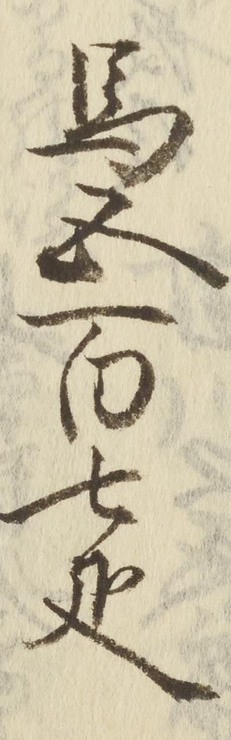馬五百七疋
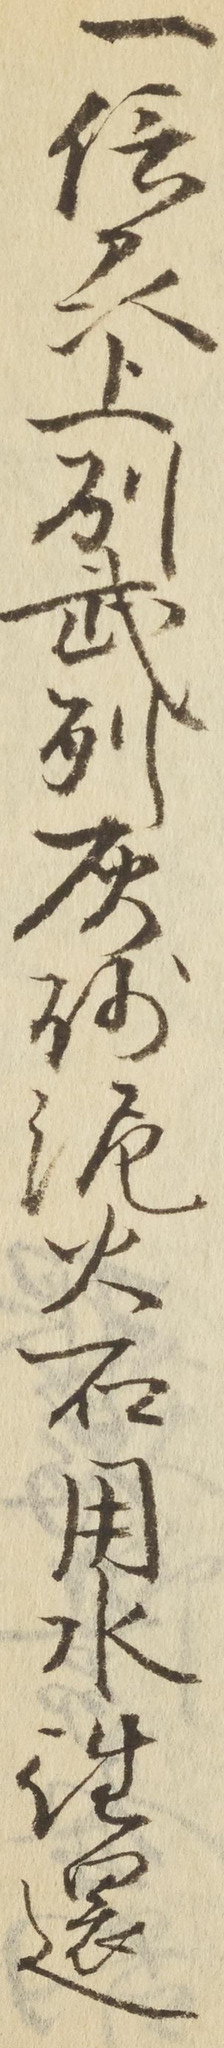一信州上州武州配砂泥火石用水往還
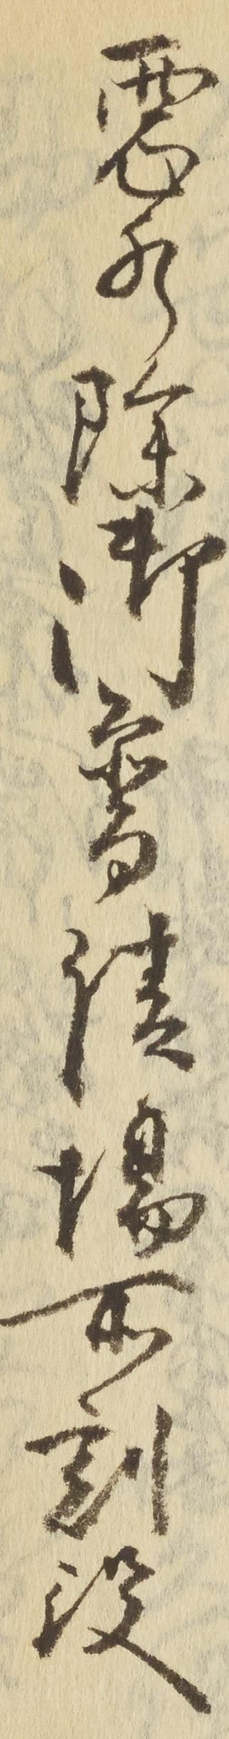悪水除御普請場所割役

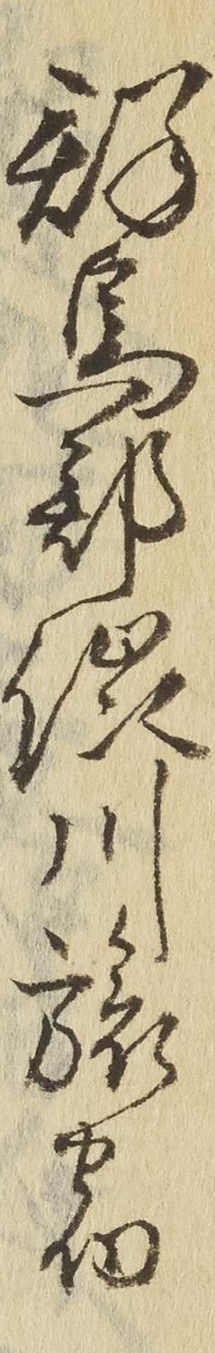群馬郡渋川旅宿
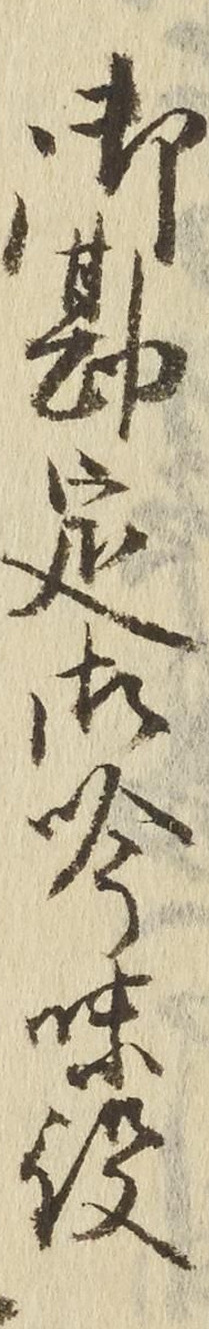御勘定御吟味役
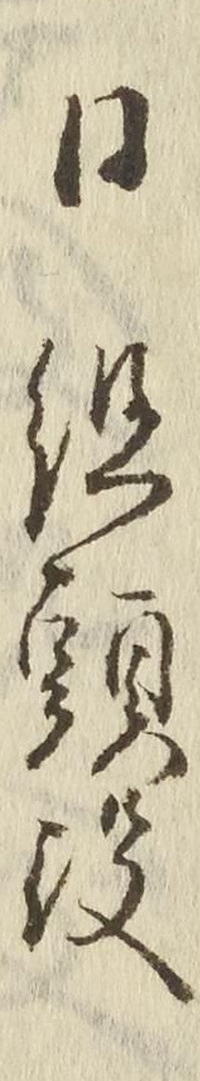同組頭役
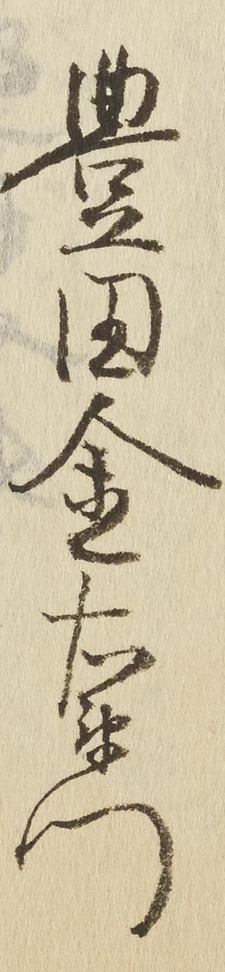豊田金右衛門
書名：浅間大變記
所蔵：東京大学地震研究所図書室 Earthquake Research Institute Library, The University of Tokyo, JAPAN
